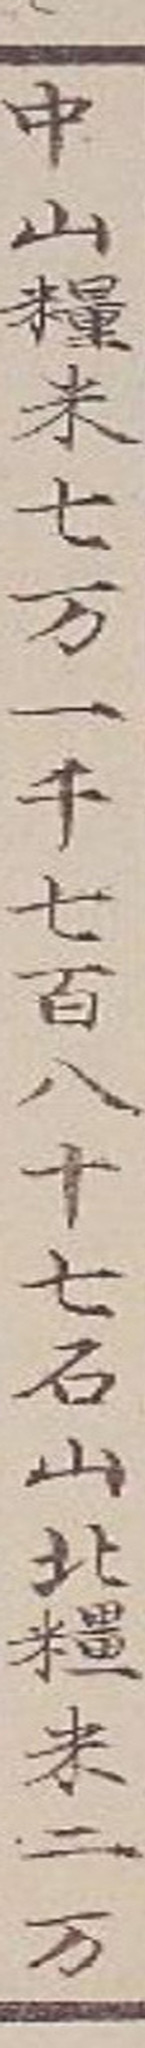中山糧米七万一千七百八十七石山北糧米二万
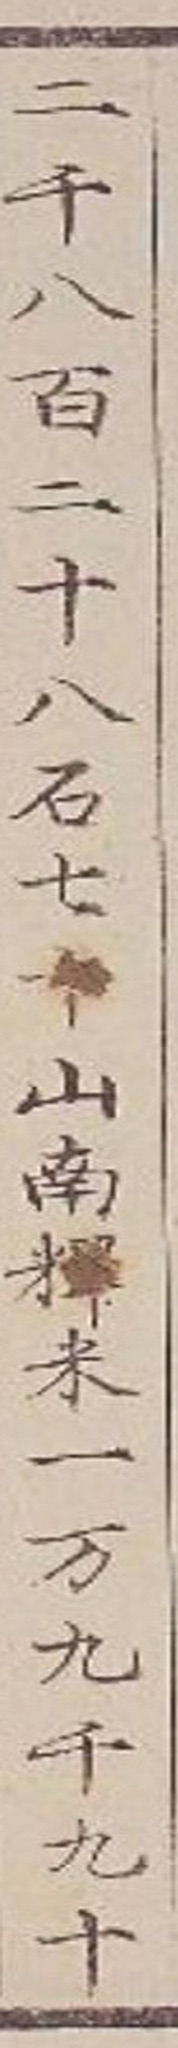二千八百二十八石七山南米一万九千九十
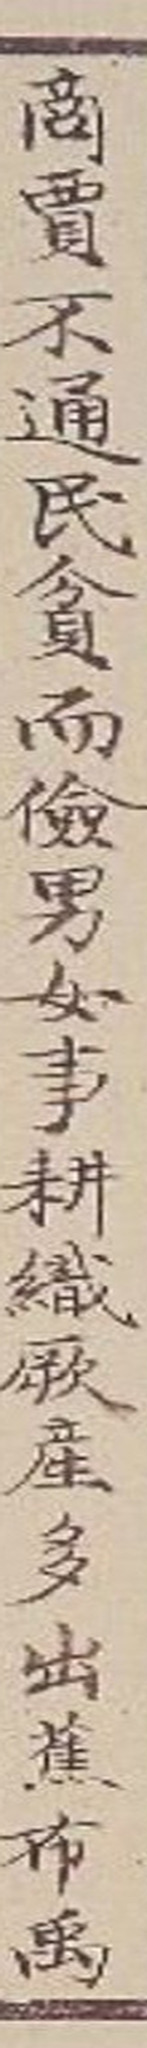商売不通民貧而倹男女事耕織厥産多出蕉布禹
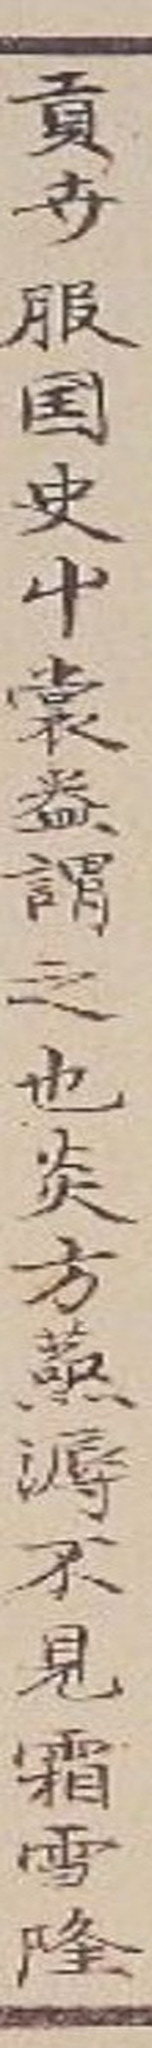貢卉服国史裳益謂之也炎方蒸溽不見霜雪隆
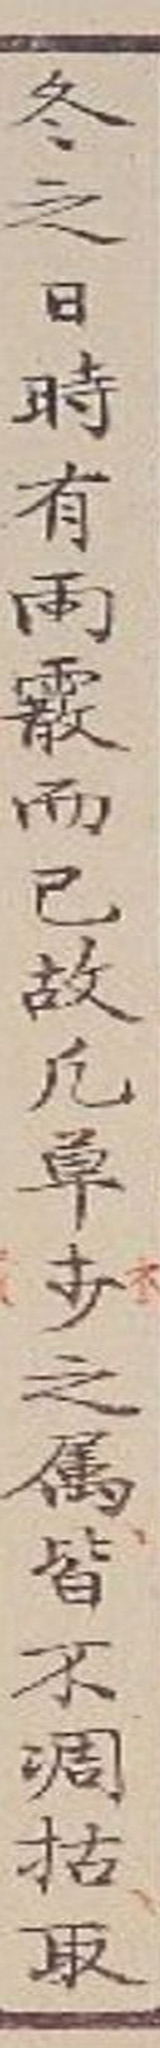冬之日時有雨霰而已故凡草卉木之属、皆不凋枯、取
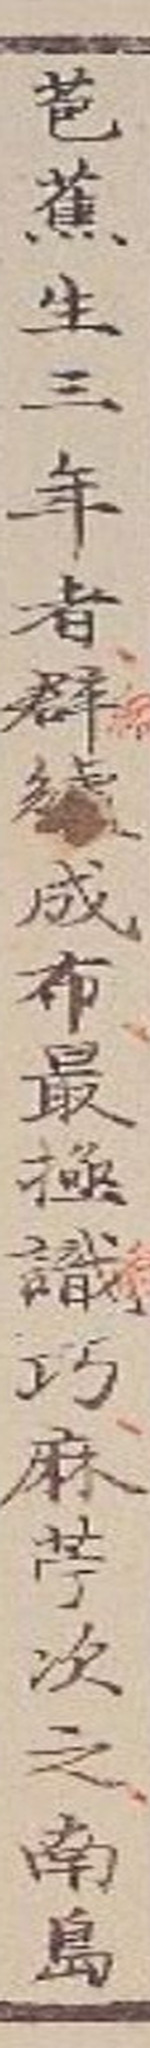芭蕉生三年者、群纑成布、最極識織巧、麻苧次之、南島
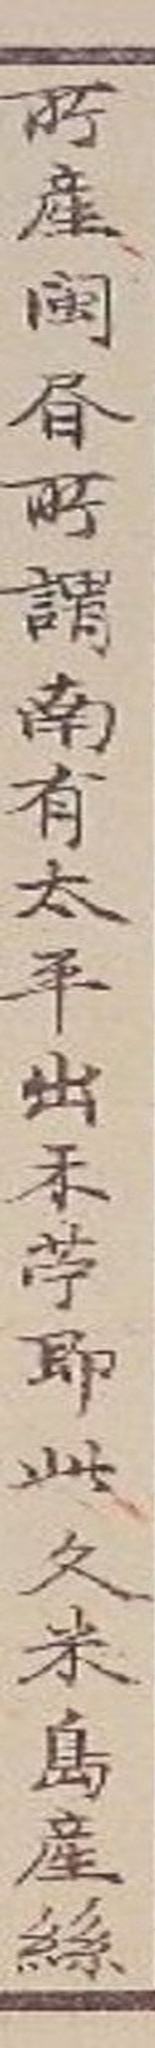所産、閩所謂南有太平出禾苧即此、久米島産糸
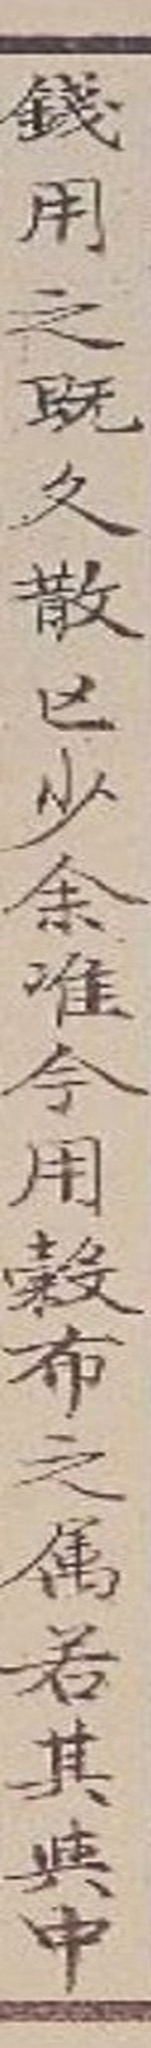銭用之既久散亡少余准今用穀布之属若其与中

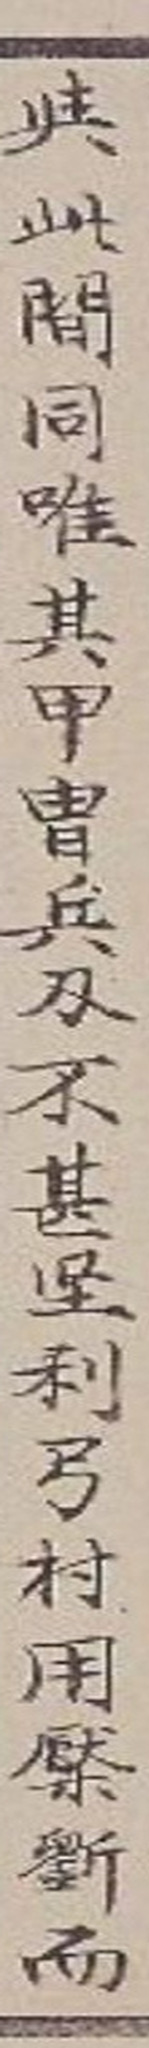与此間同唯其甲冑兵刃不甚堅利弓村用檿斵而
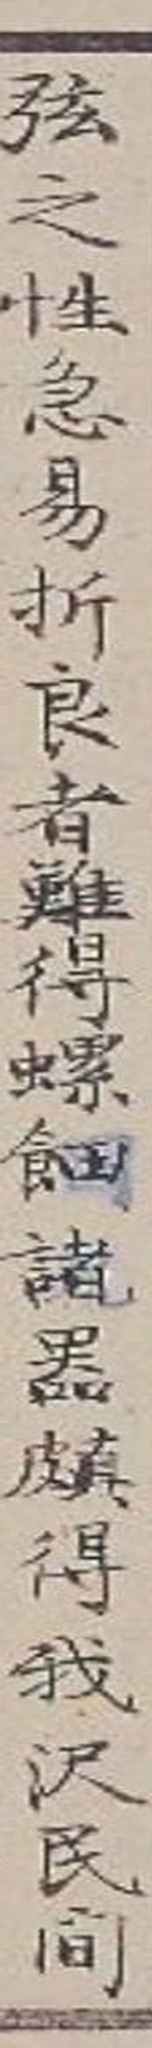弦之性急易折良者難得螺諸器得我沢民間
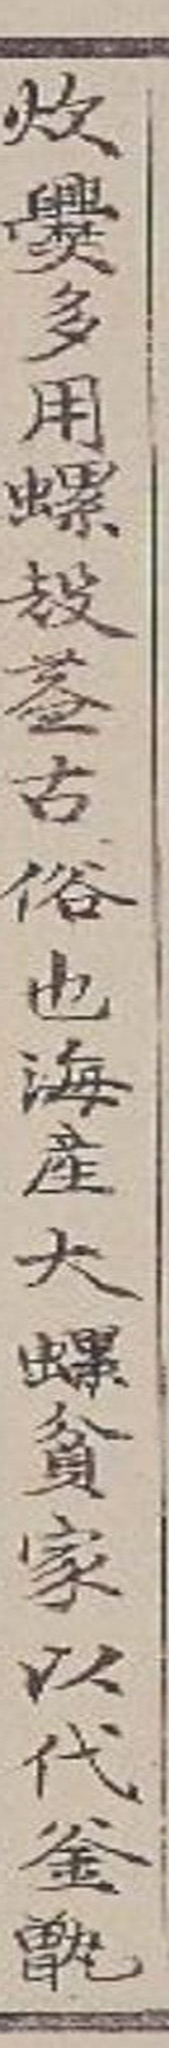炊爨多用螺殻蓋古俗也海産大螺貧家以代釜甑
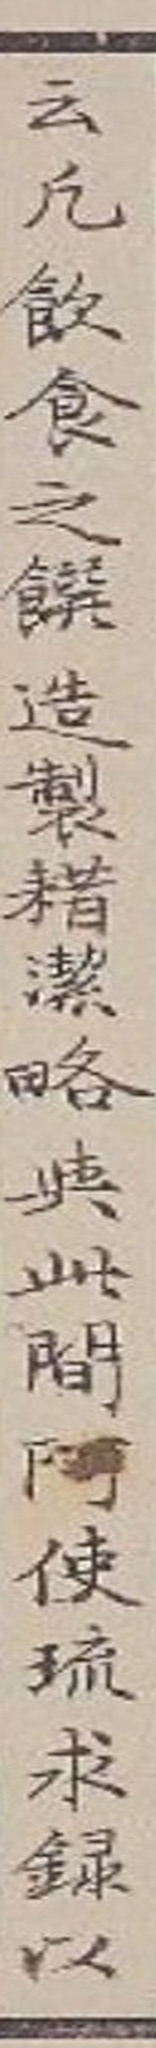云凡飲食之饌造製耤潔略与此間阿使琉求録以
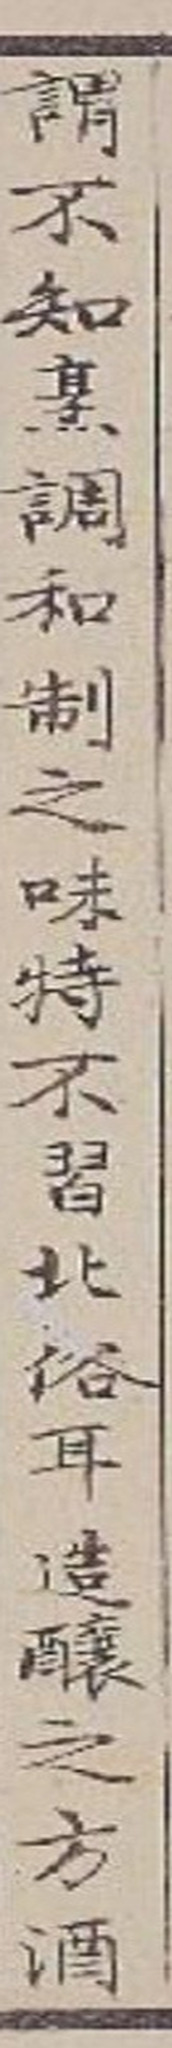謂不知烹調和制之味特不習北俗耳造釀之方酒
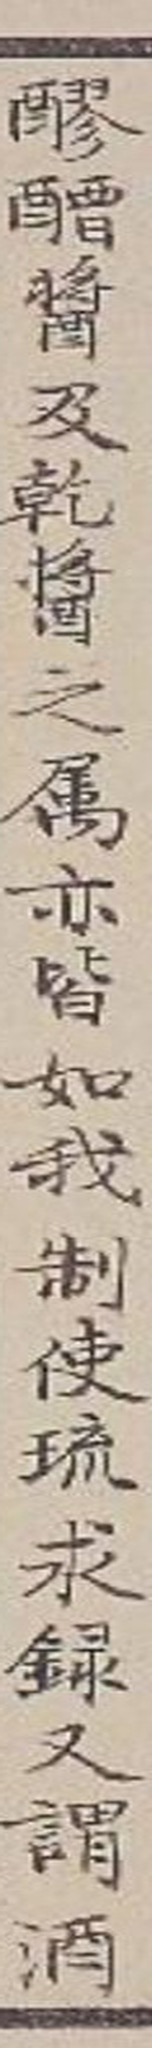醪醬及乾醬之属亦皆如我制使琉求録又謂酒
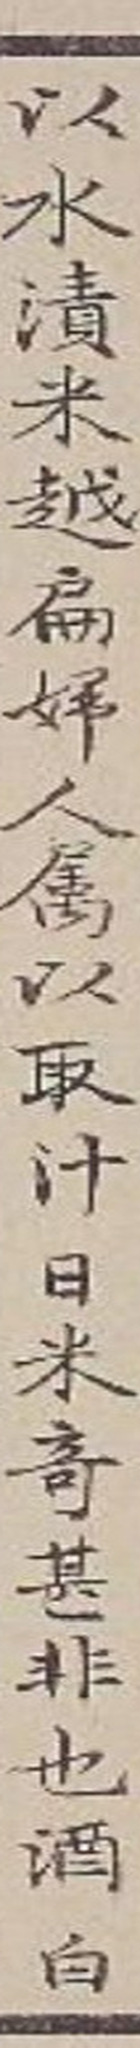以水漬米越扁婦人属以取汁日米奇甚非也酒白
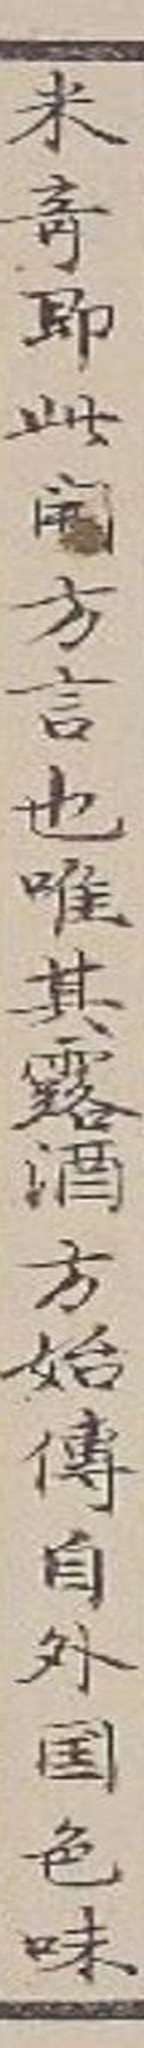米奇即此開方言也唯其露酒方始伝自外国色味
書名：南島志 全
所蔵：University of the Ryukyus Library
